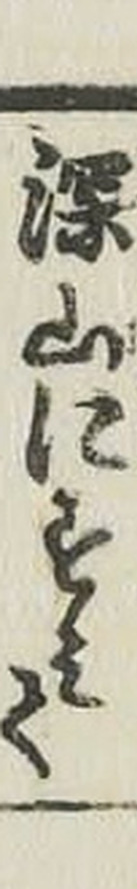深山にすみて
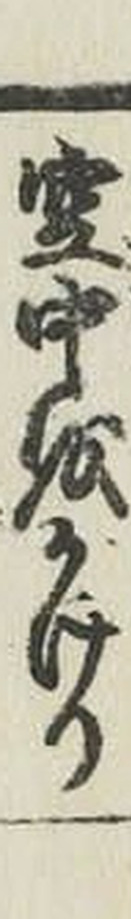空中をかけり
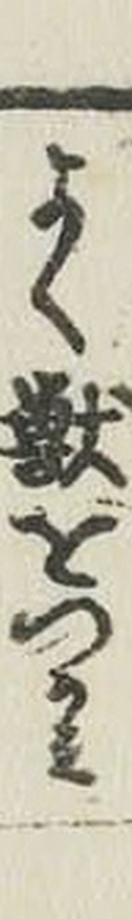よく獣をつかみ
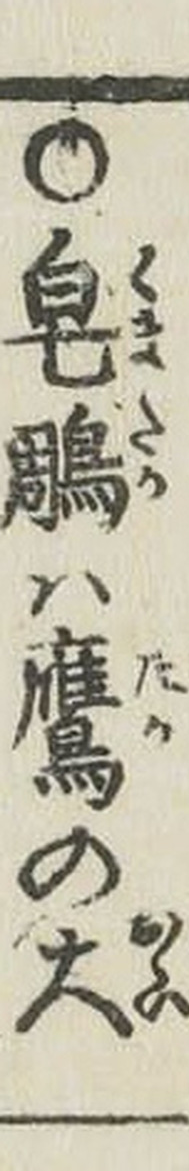○皂鵰は鷹の大
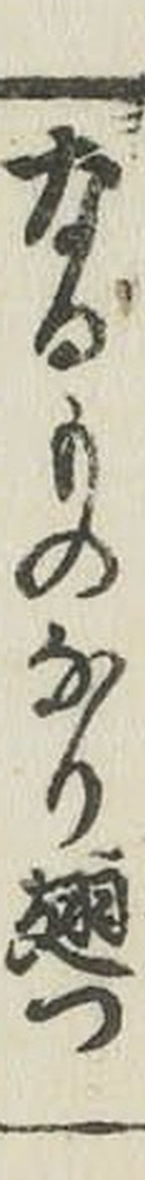なるものなり翅つ
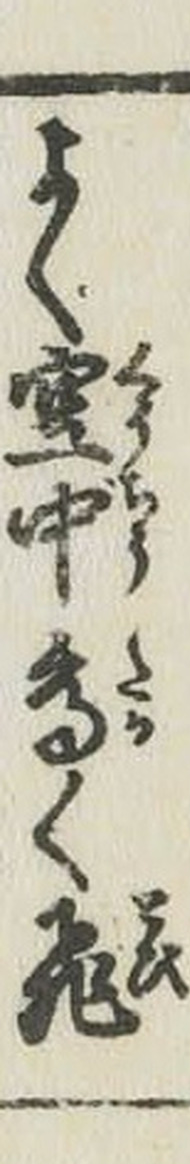よく空中高く飛
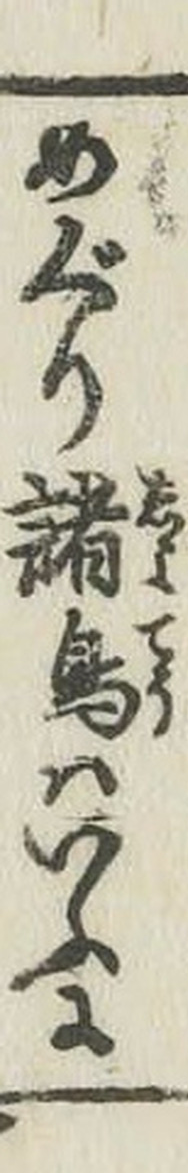めぐり諸鳥はいふに
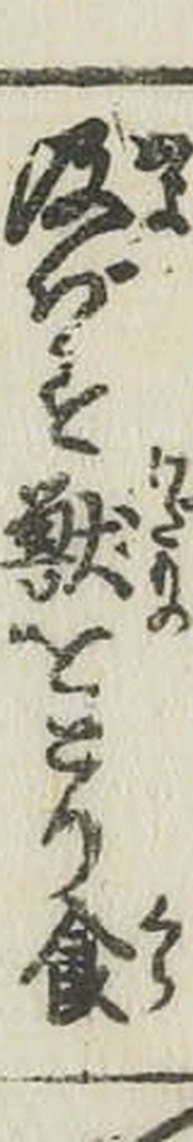及ばす獣をとり食
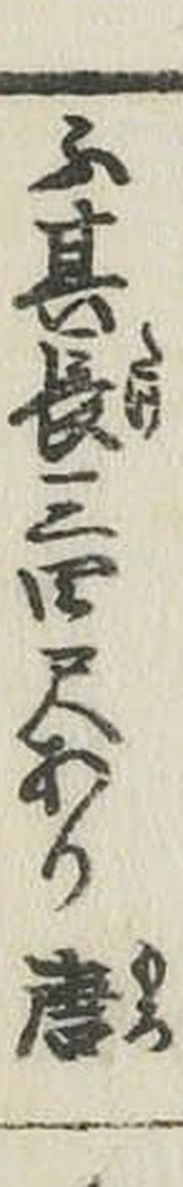ふ其長三四尺あり唐
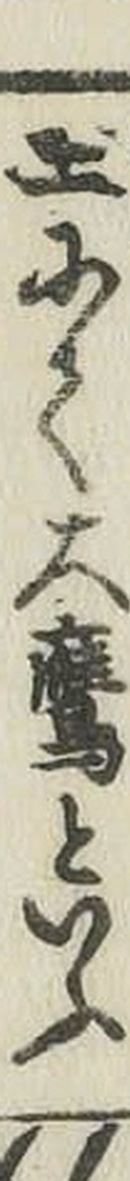土にて大鷹といふ
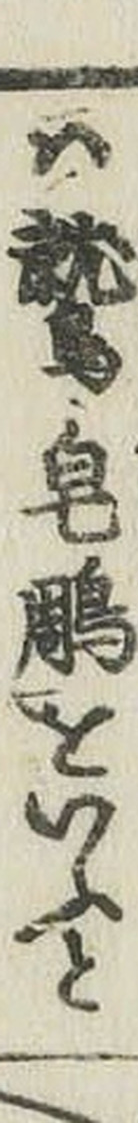は鷲皂鵰をいふと
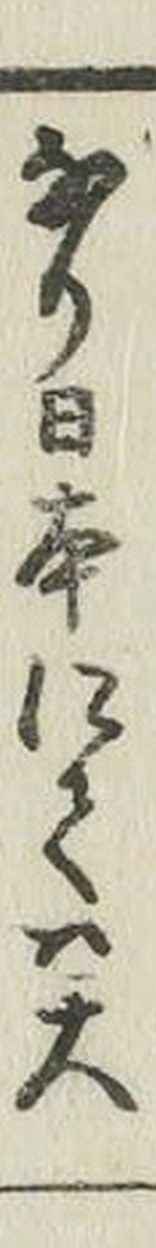なり日本にては大
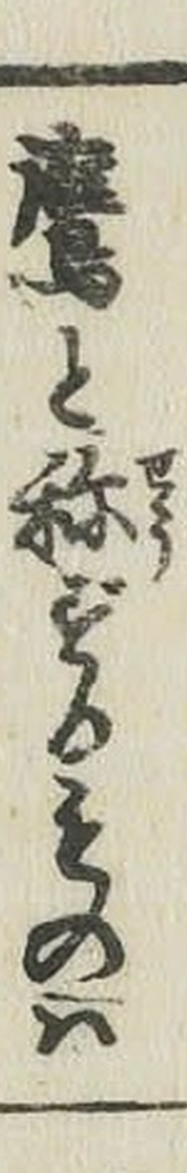鷹と称ずるものは
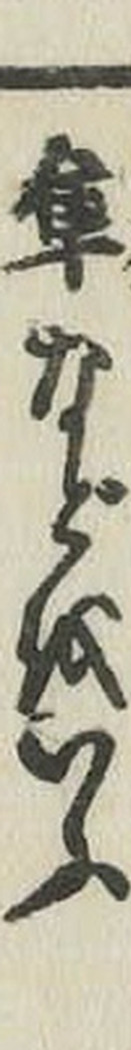隼などをいふ

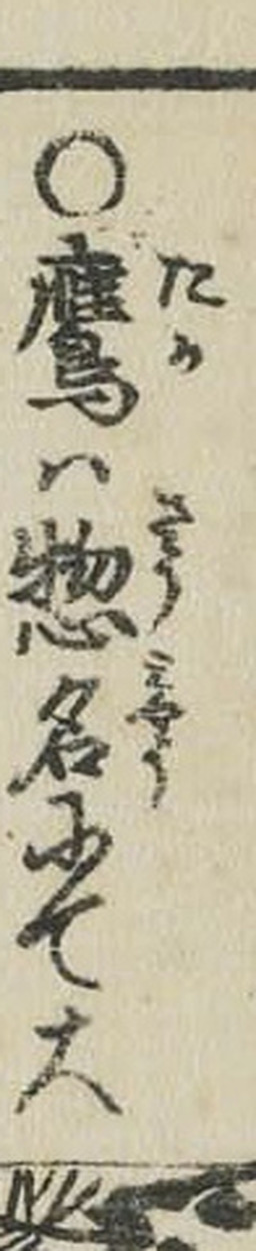○鷹は惣名にて大
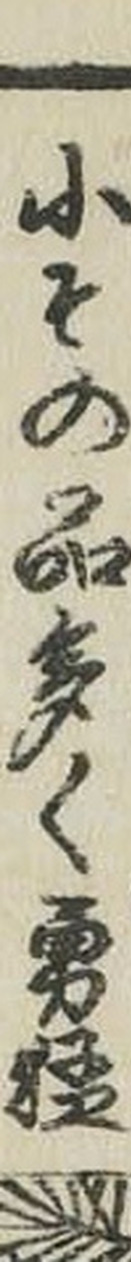小その品多く勇猛
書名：増補頭書訓蒙図彙大成 10巻 6:巻之12-13
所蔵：東京学芸大学教育コンテンツアーカイブ
